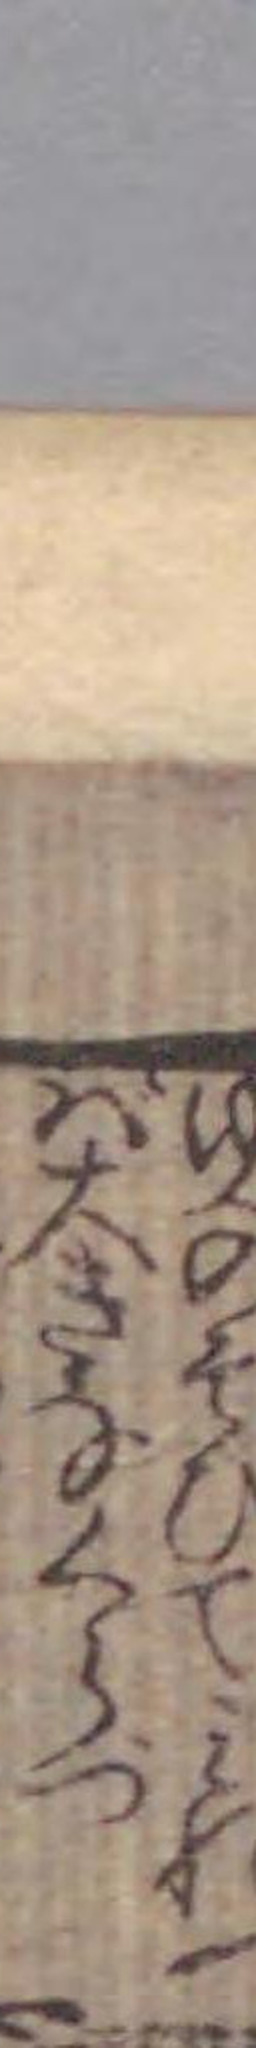ば大きなくらづ
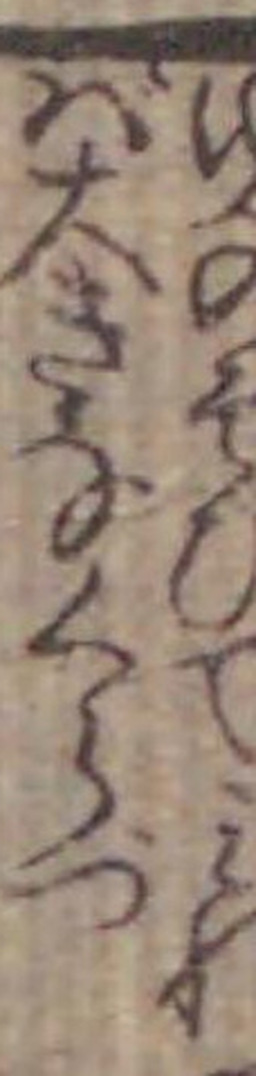ば大きなくらづ
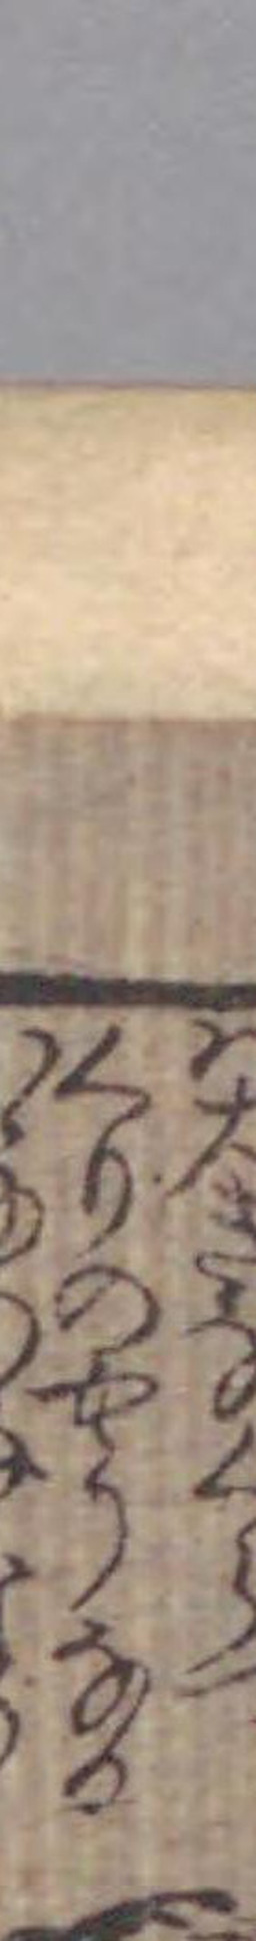くりのやうなる
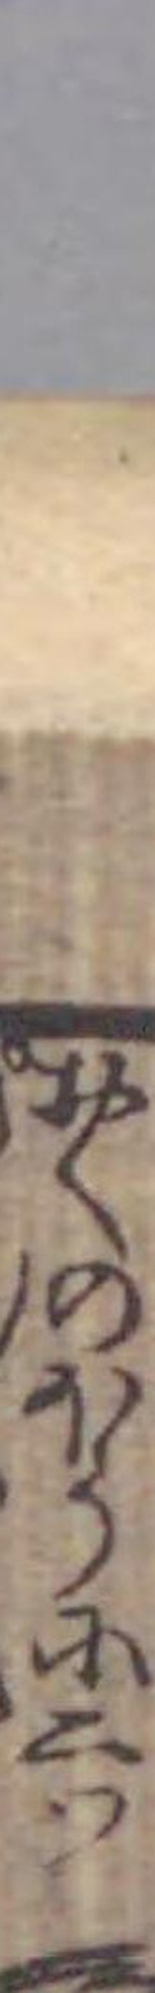おくのほうに二つ
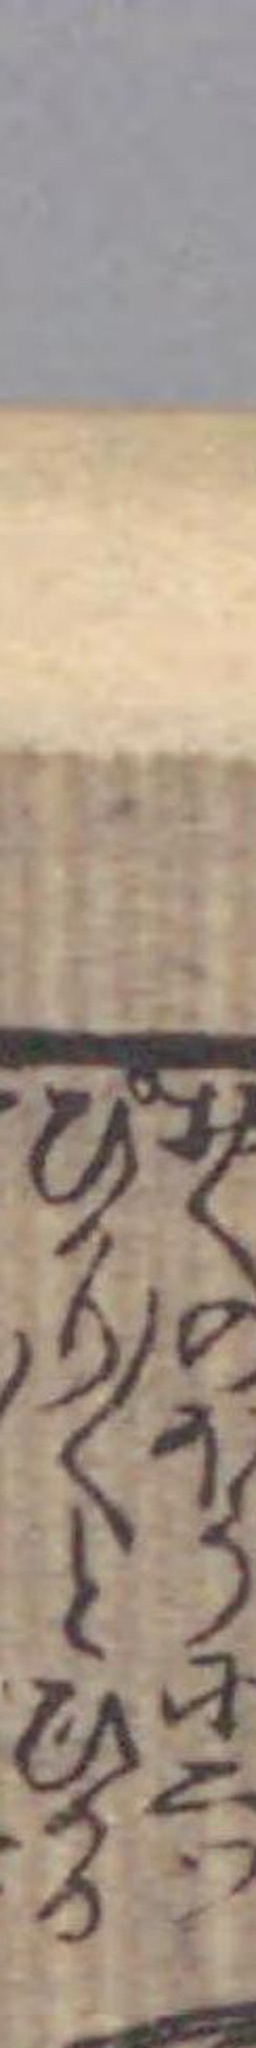びかり〳〵とひかる
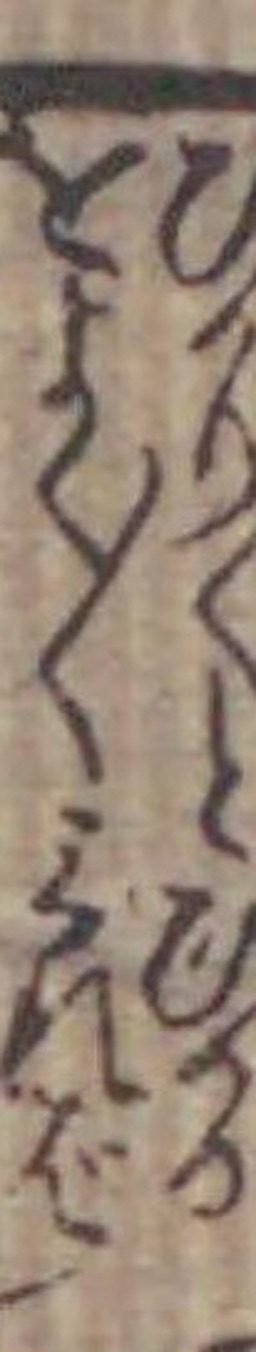をよく〳〵みれば
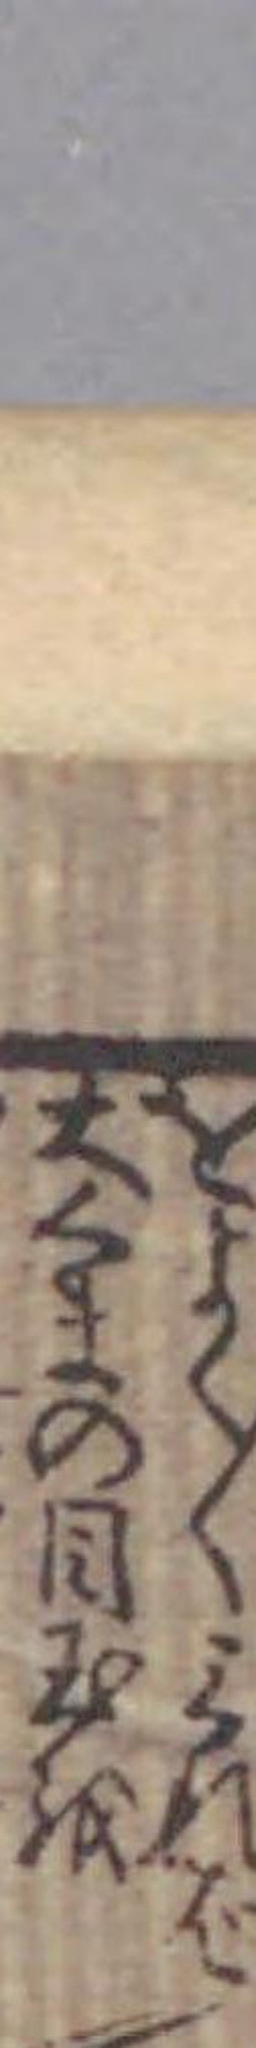大くまの目玉を
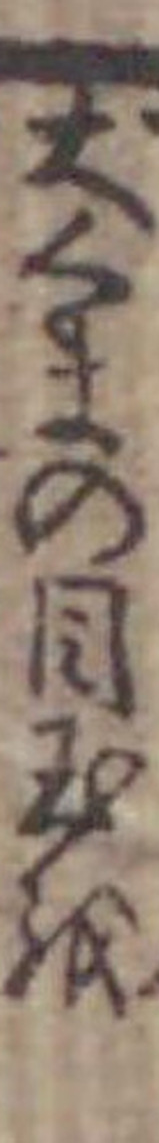大くまの目玉を
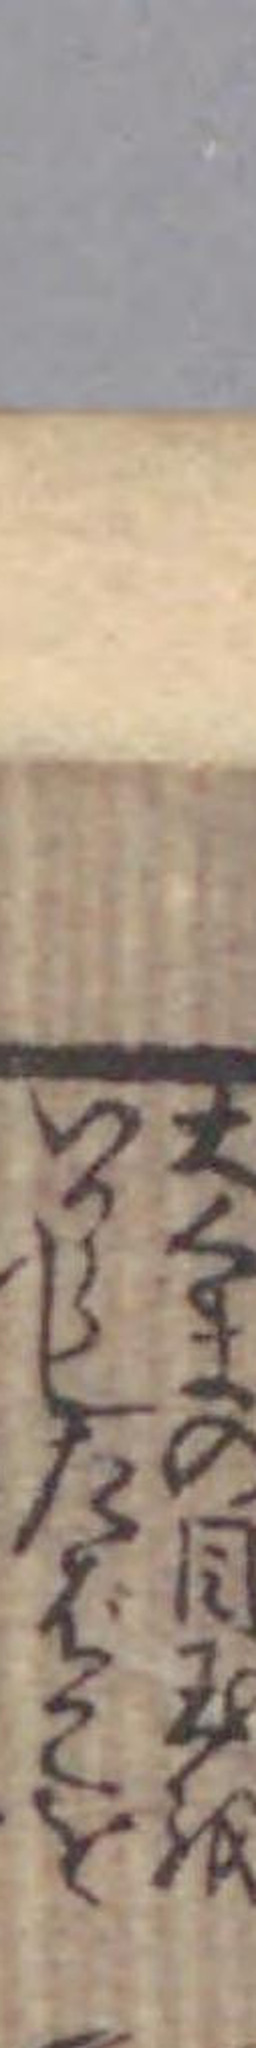いからしたばこを
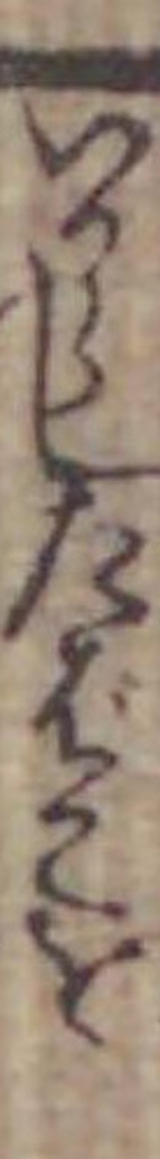いからしたばこを
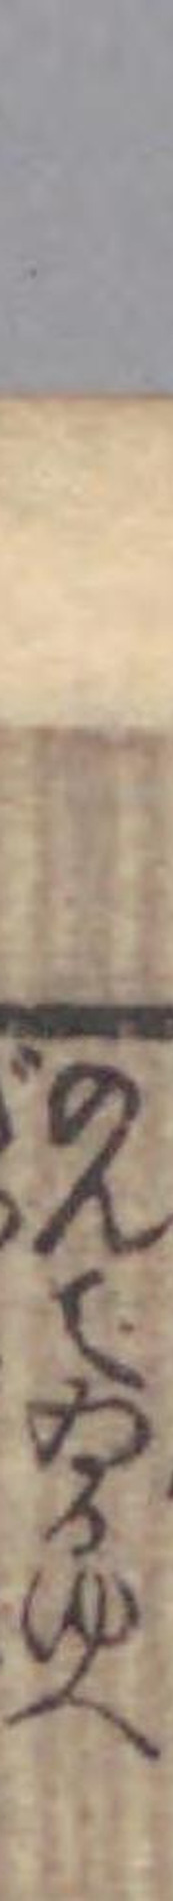のんでゐるゆへ
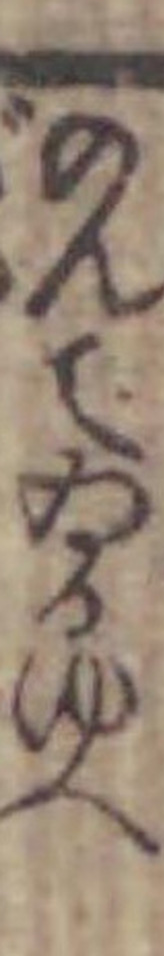のんでゐるゆへ
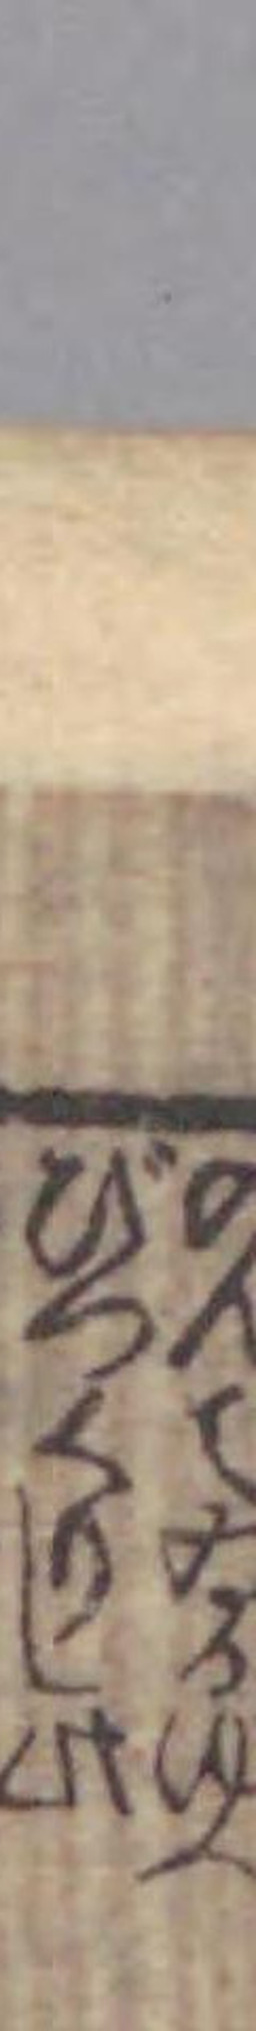びつくりし此
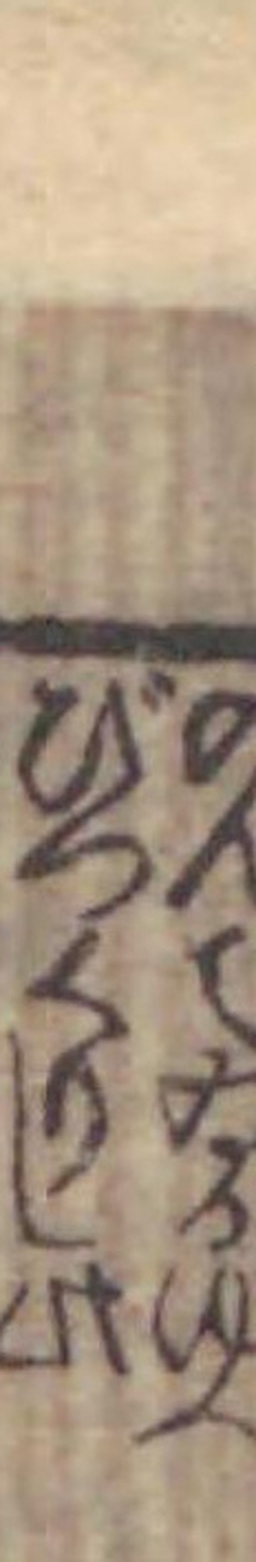びつくりし此
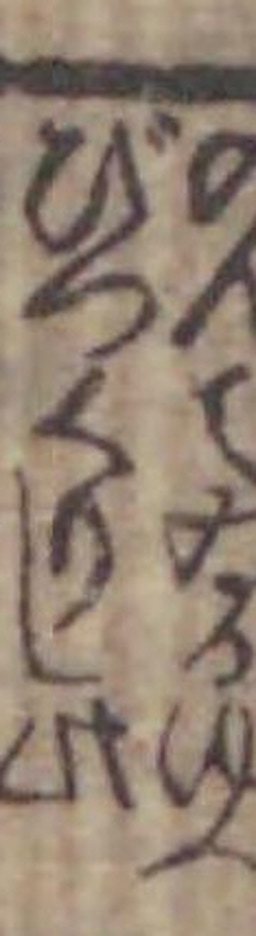びつくりし此
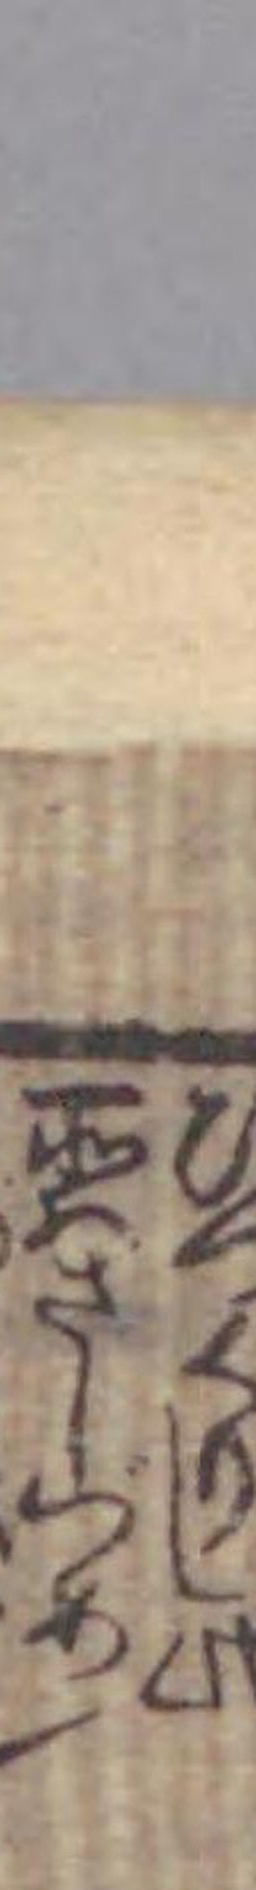所はさしづめ
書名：即席耳学問 : 3巻
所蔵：国立国会図書館 National Diet Library, JAPAN
